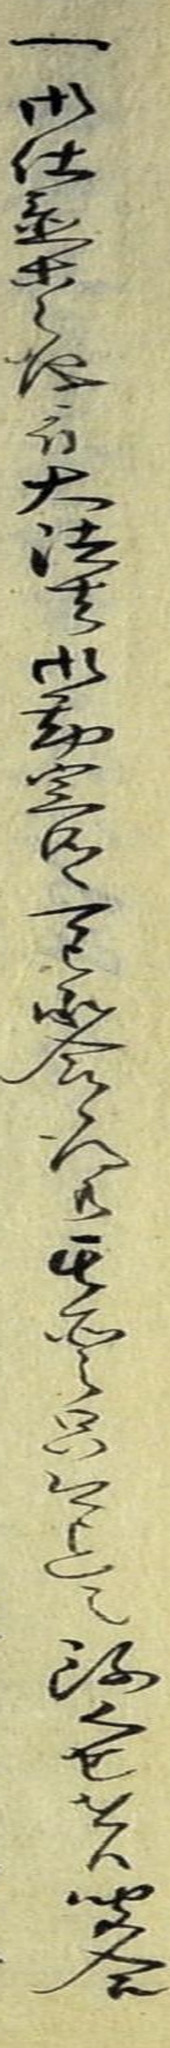一御仕置等之儀ニ付大法者御勘定所へ可被承合候得共其所之只今迄之致くせをハ聞合
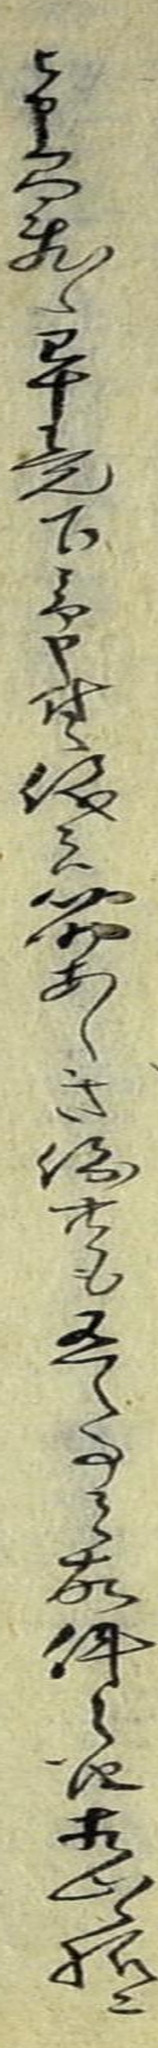被申間敷候畢竟下ニ而申付候儀ニハ筋あしき儀共へも有之事ニ候故件之儀相止候様ニ
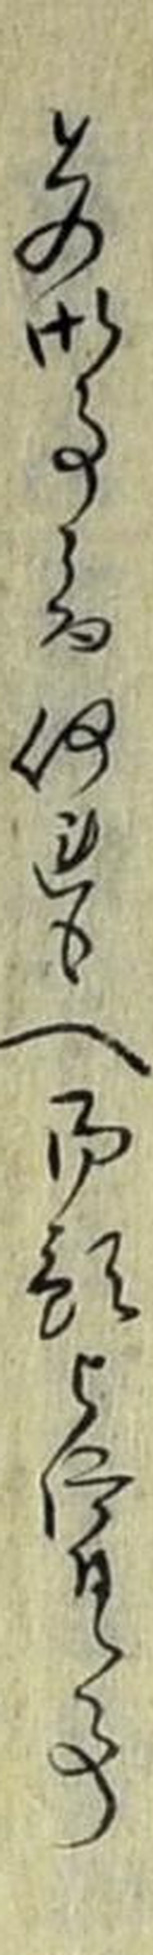との御事ニ而何れもへ御預被仰付候事
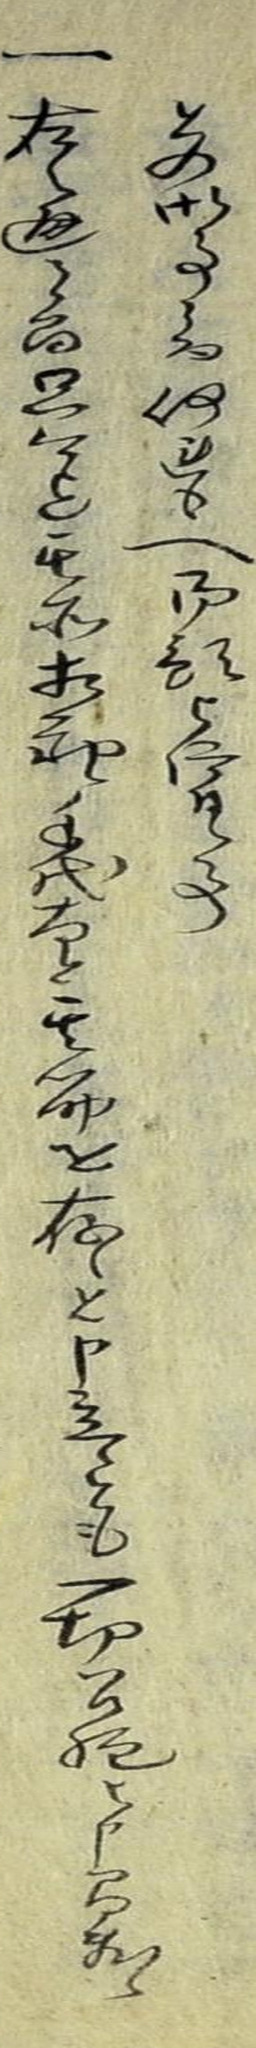一右之通ニ候間只今迄其所相勤候手代なと其筋を存候と申立候とも一切召抱被申間敷候
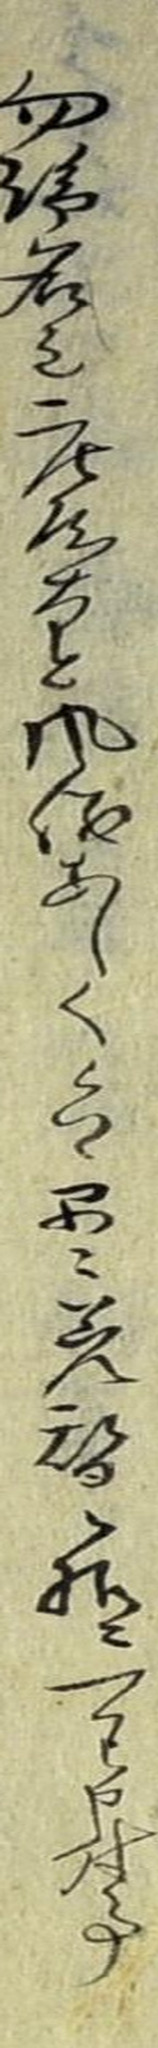勿論名主庄屋なと風儀あしく候ハヽ早々差替候様ニ可被申付事
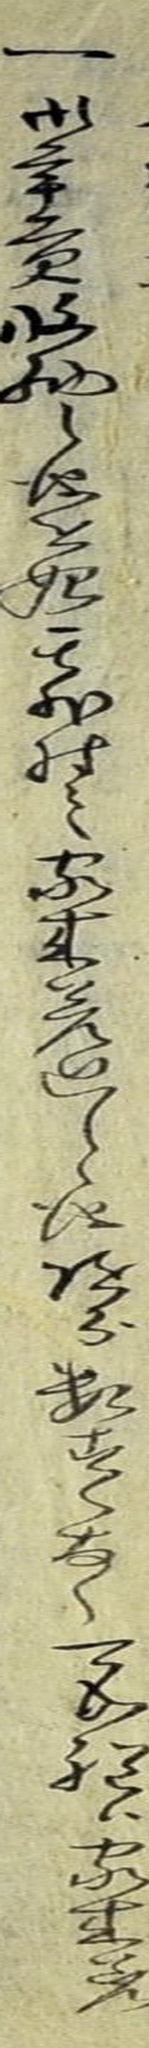一御年貢収納之儀を始其外村々之家来差廻し候儀随分数すくなく可成程ハ家来差
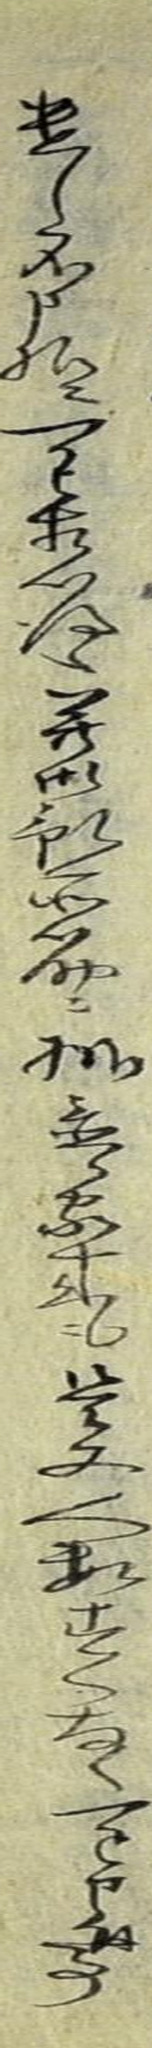遣し不申様ニ可被相心得候并御預所筋ニ掛置候家来も是又人数すくなく可被申付事
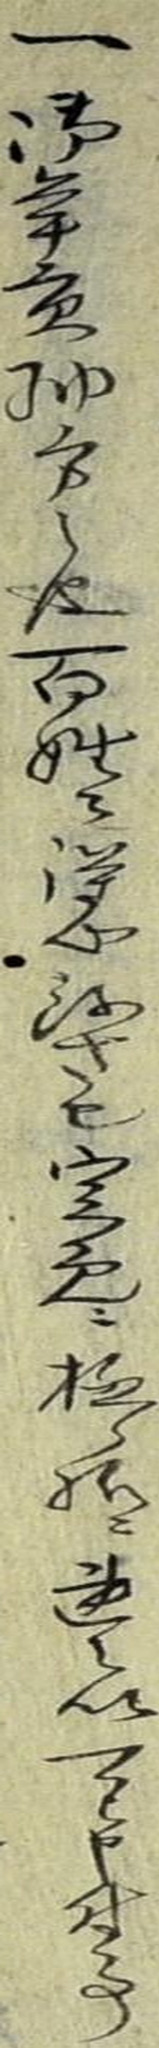一御年貢納方之儀百姓ニ得心致させ定免ニ極候様ニ連々以可被申付事
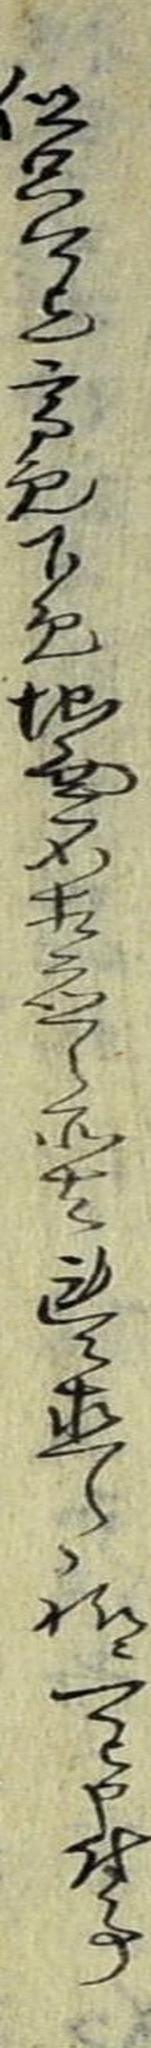但只今迄高免下免地面不相応之所者連々直し候様ニ可被申付事
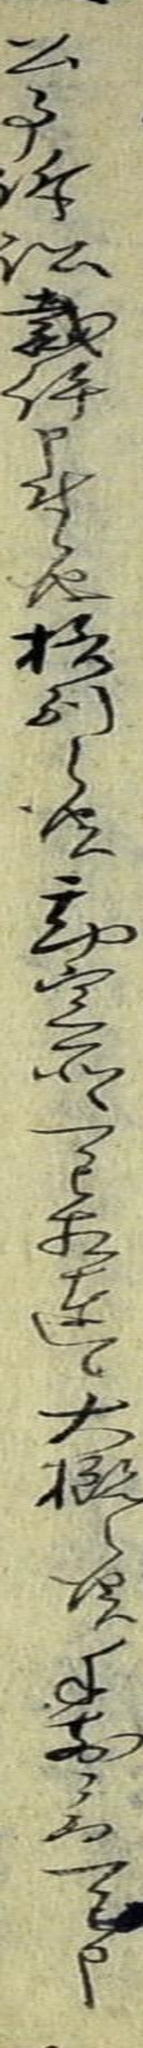一公事訴訟裁許申付候儀格別之儀ハ勘定所へ可被相達候大概之儀ハ手前ニ而可被申
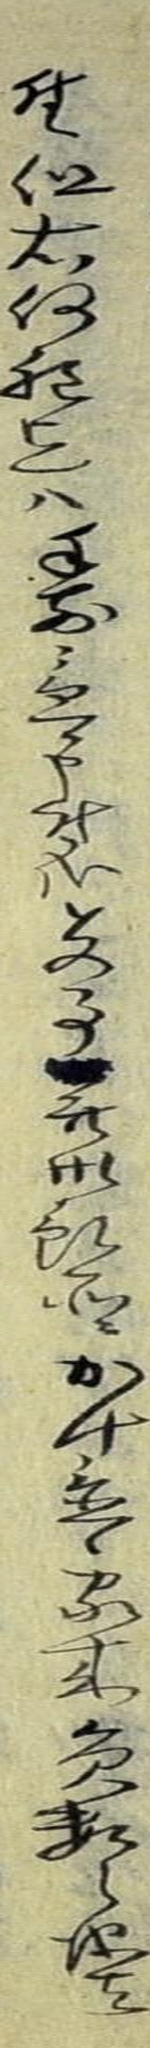付候但右何程迄ハ手前ニ而可申付哉との事并御預所ニかけ置候家来員数之儀者
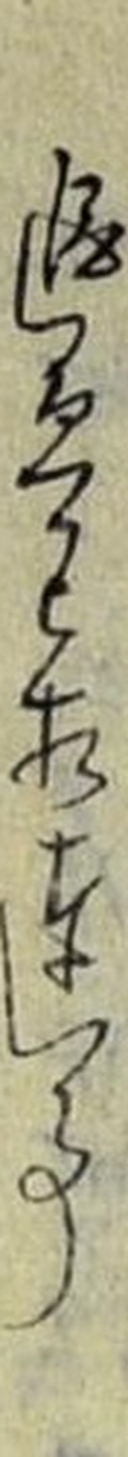追而可被相達事
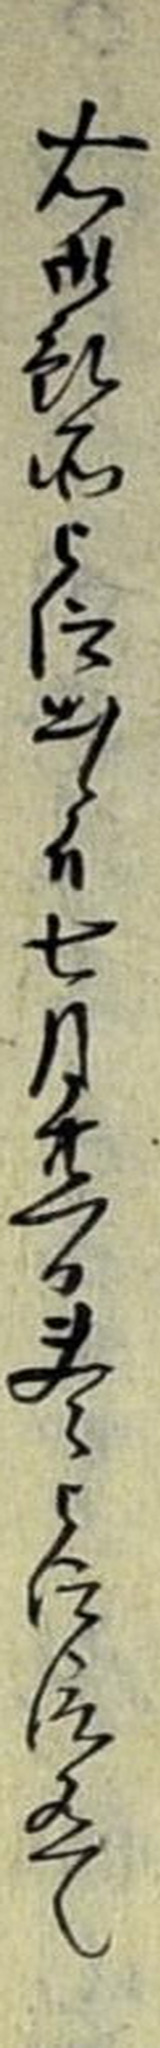右御預所被仰出候ニ付七月廿一日夫々被仰渡有之
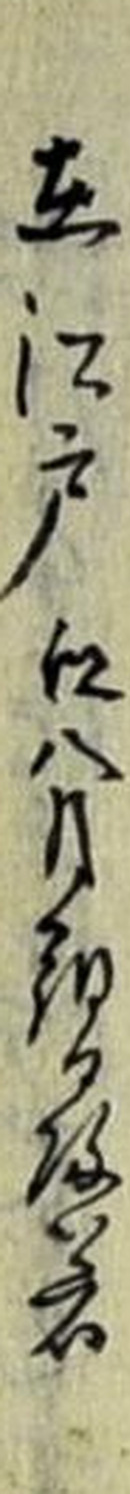在江戸但八月朔日帰着
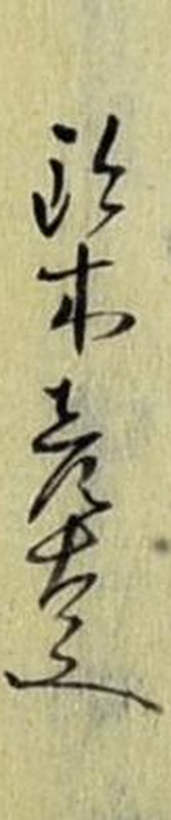鈴木彦大夫
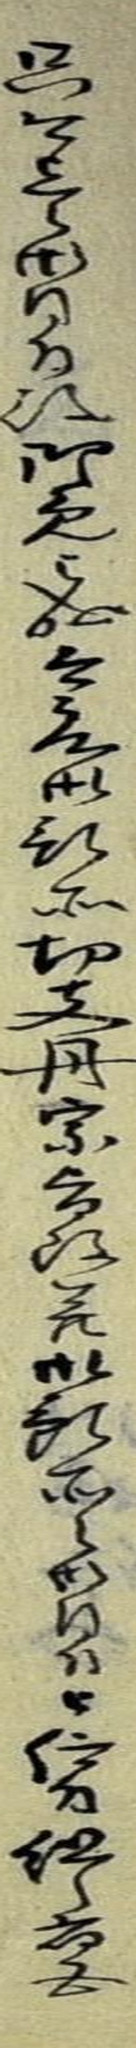只今迄之御目付役御免被成今度御預所切支丹宗旨改并御預所之御目付被仰付組之者五
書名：命令之部 一
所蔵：福井県文書館 Fukui Prefectural Archives
